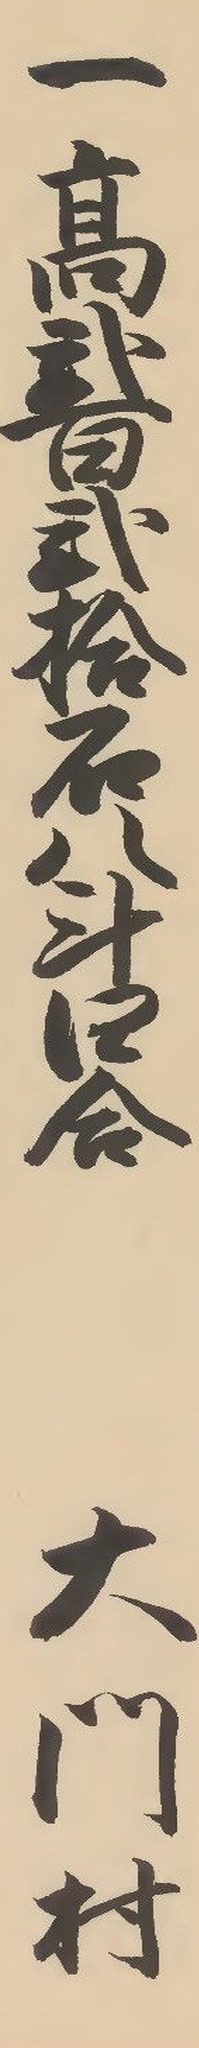一髙弐百弐拾石八斗四合大門村
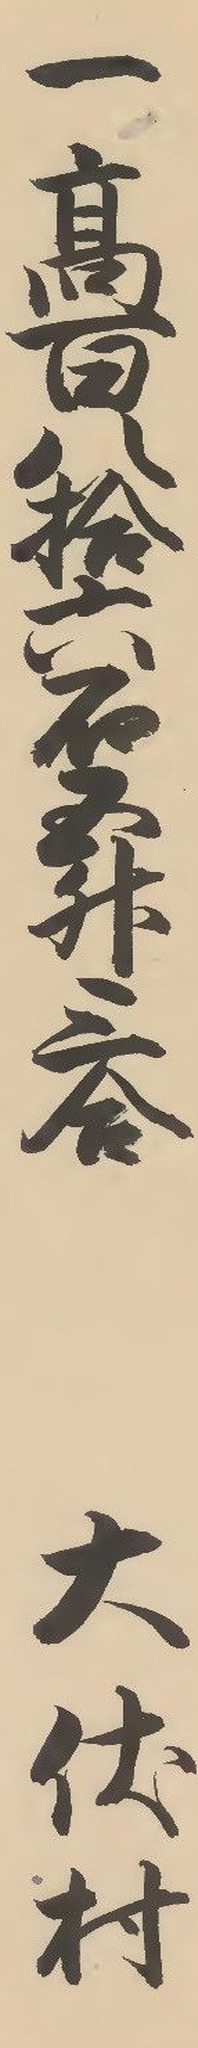一髙百八拾六石五升三合大伏村
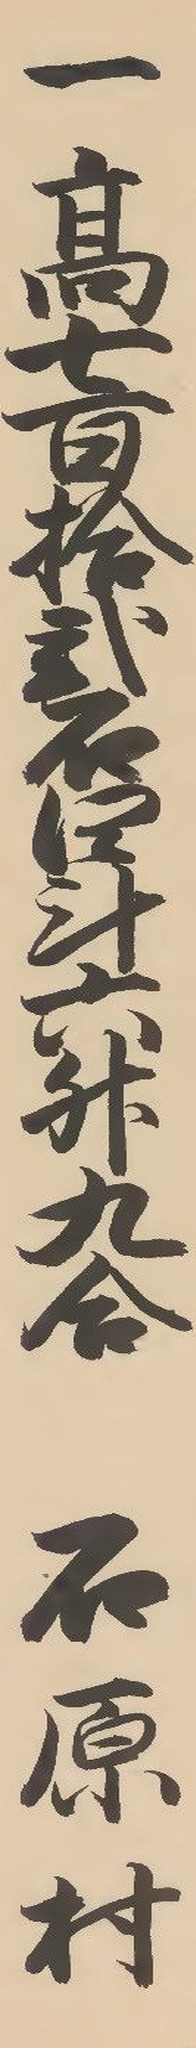一髙七百拾弐石四斗六升九合石原村
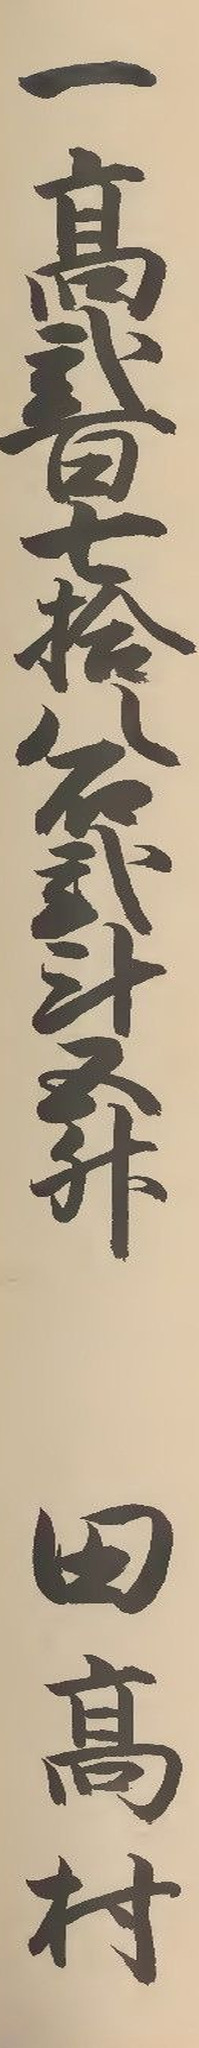一髙弐百七拾八石弐斗五升田髙村
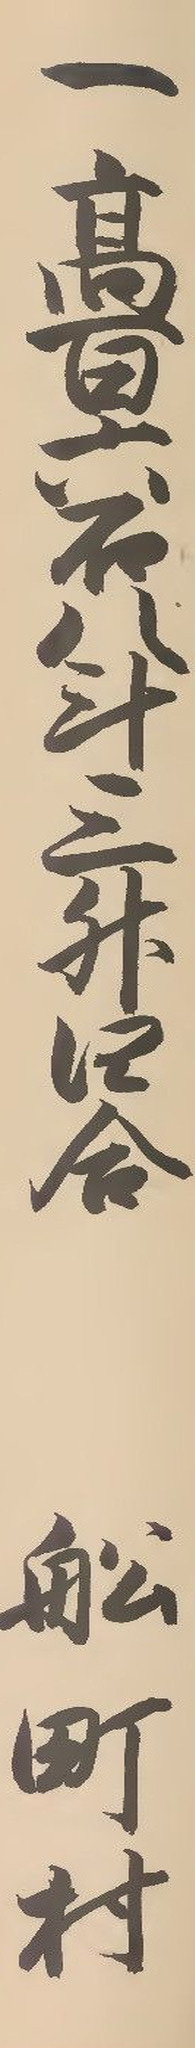一髙百六石八斗三升四合舩町村
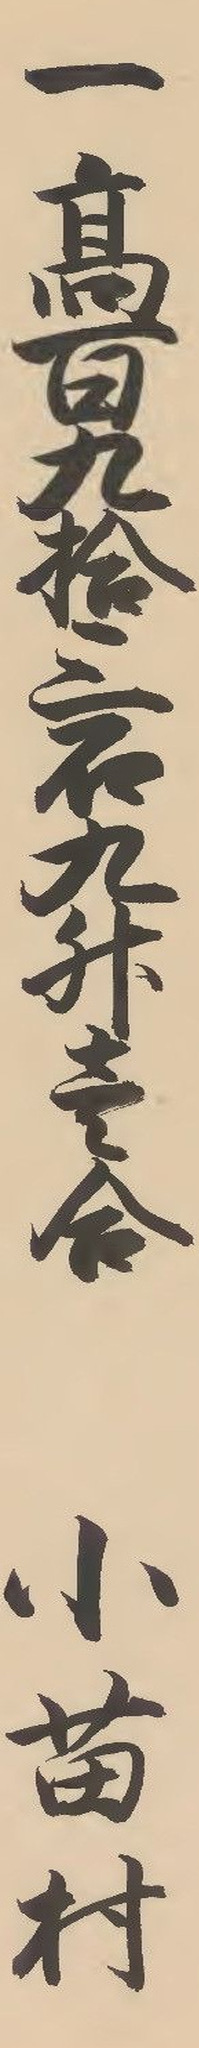一髙百九拾三石九升壱合小苗村
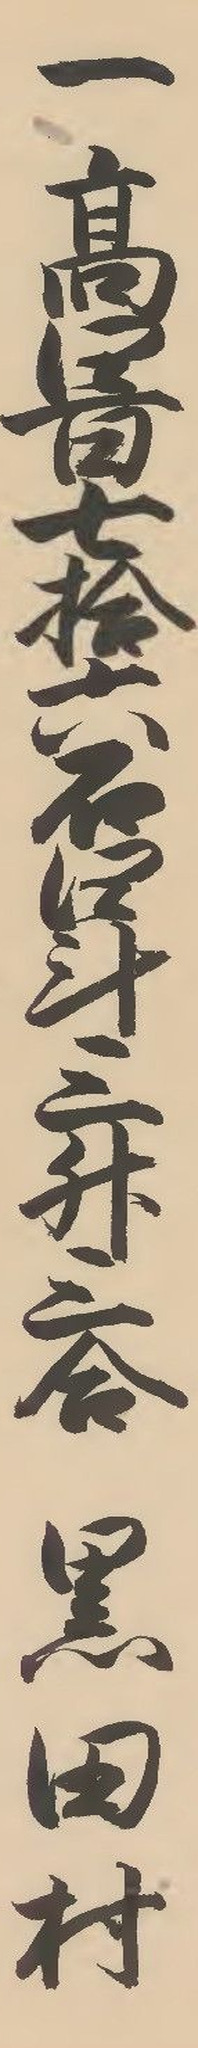一髙四百七拾六石四斗三升三合黑田村
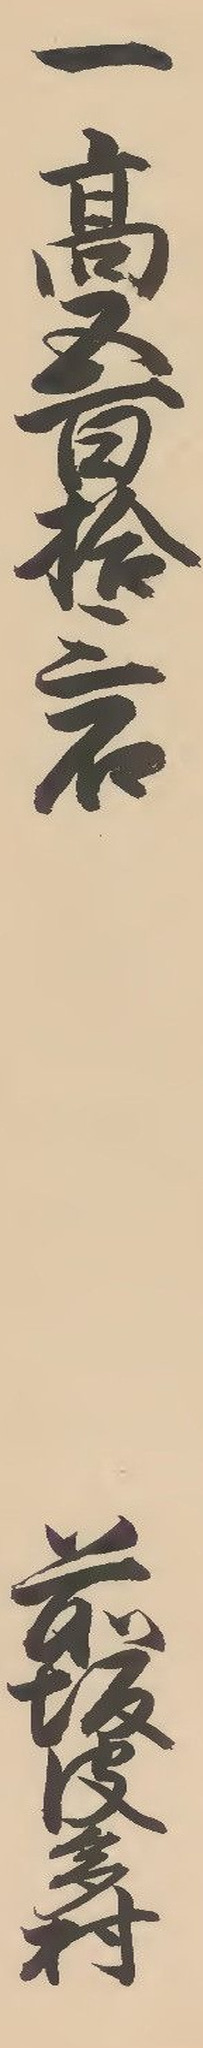一髙五百拾三石前坂皮多村

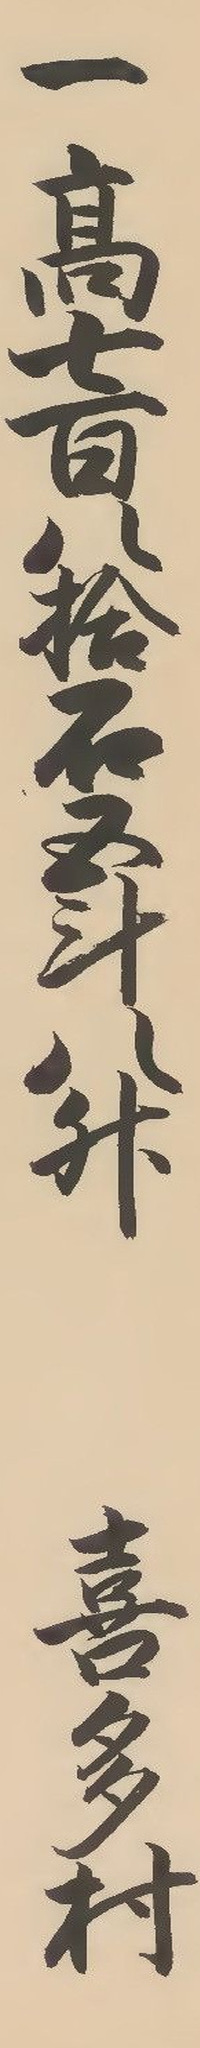一髙七百八拾石五斗八升喜多村
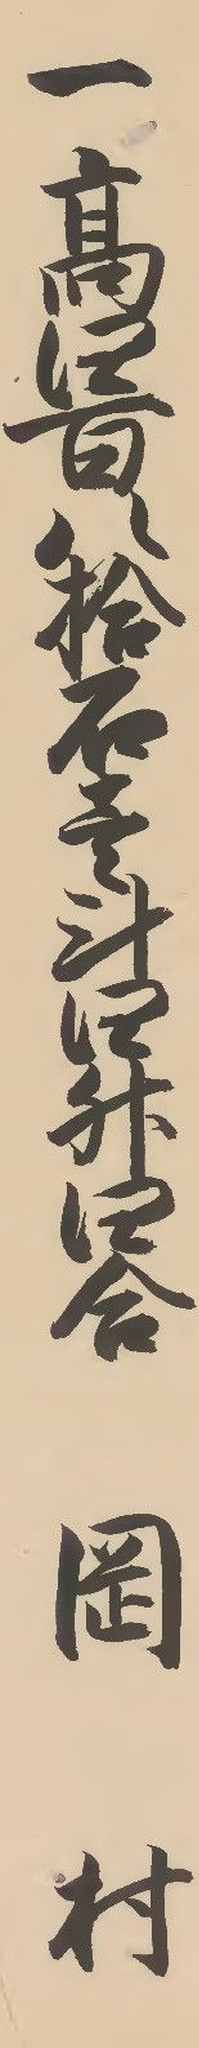一髙四百八拾石壱斗四升四合岡村
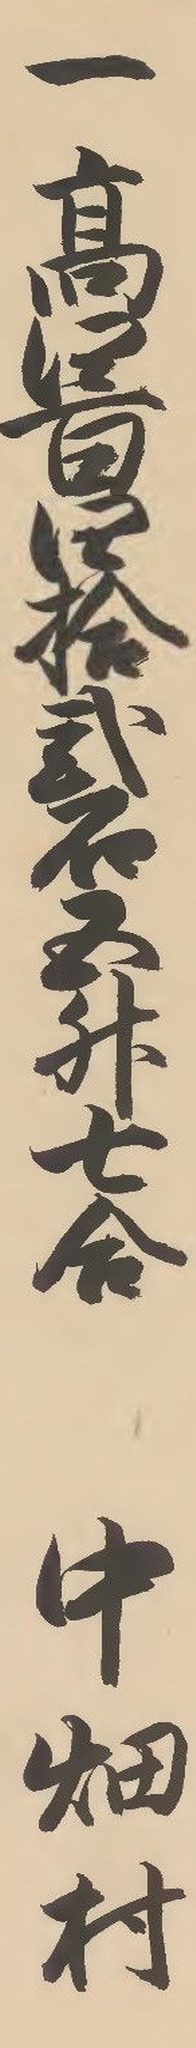一髙四百四拾弐石五升七合中畑村
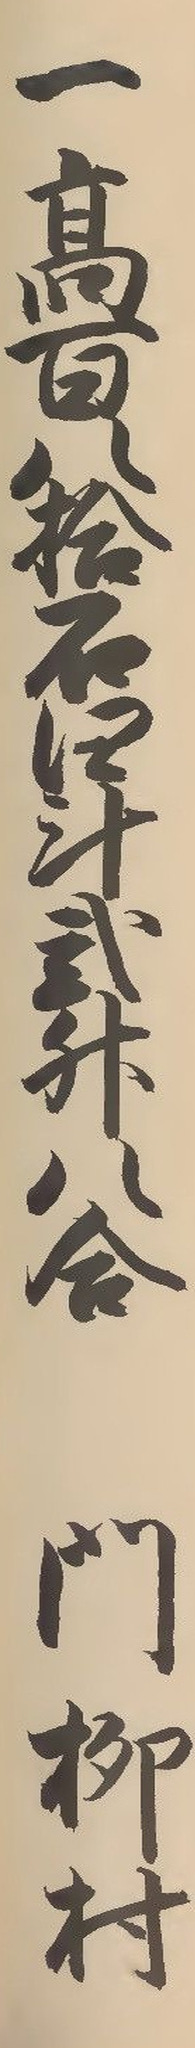一髙百八拾石四斗弐升八合門柳村
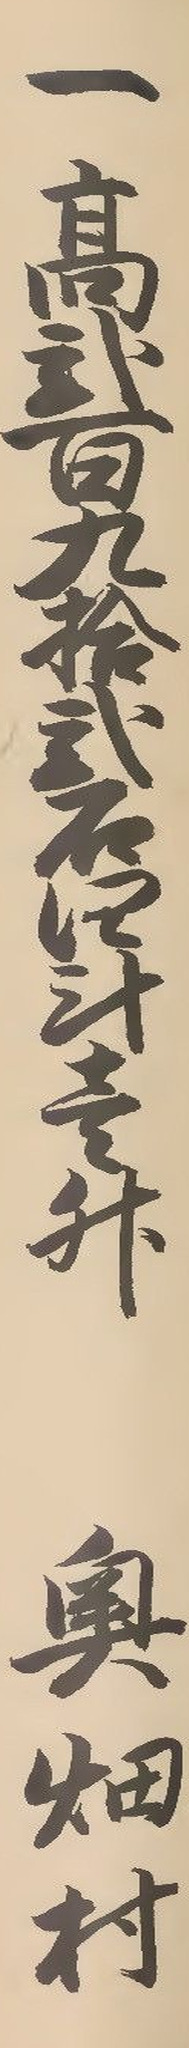一髙弐百九拾弐石四斗壱升奥畑村
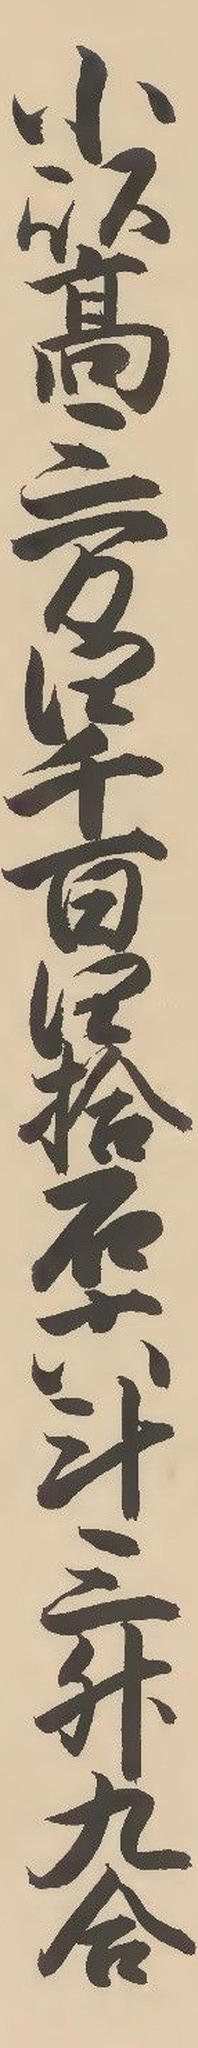小以髙三万四千百四拾石六斗三升九合

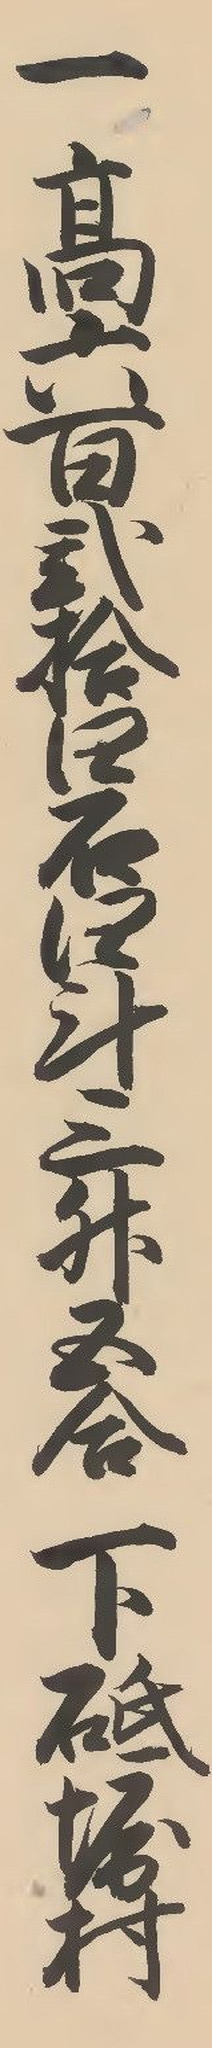一髙六百弐拾四石四斗三升五合下砥堀村
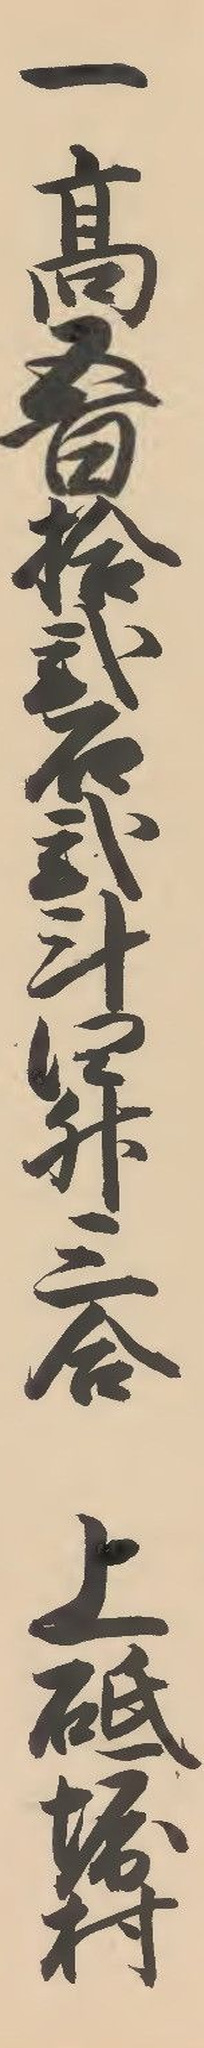一髙五百拾弐石弐斗四升三合上砥堀村
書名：播磨国郷帳
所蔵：国立公文書館 National Archives of Japan
